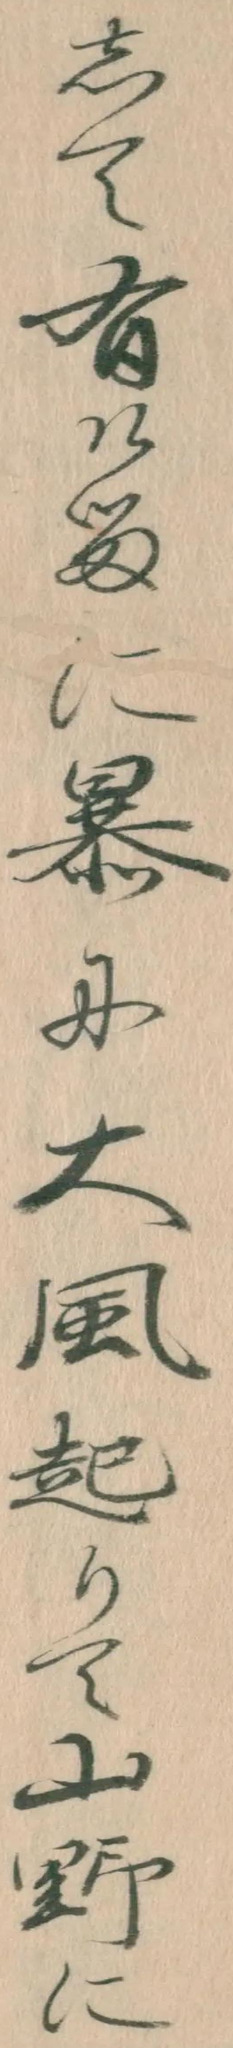して有けるに暴に大風起りて山野に
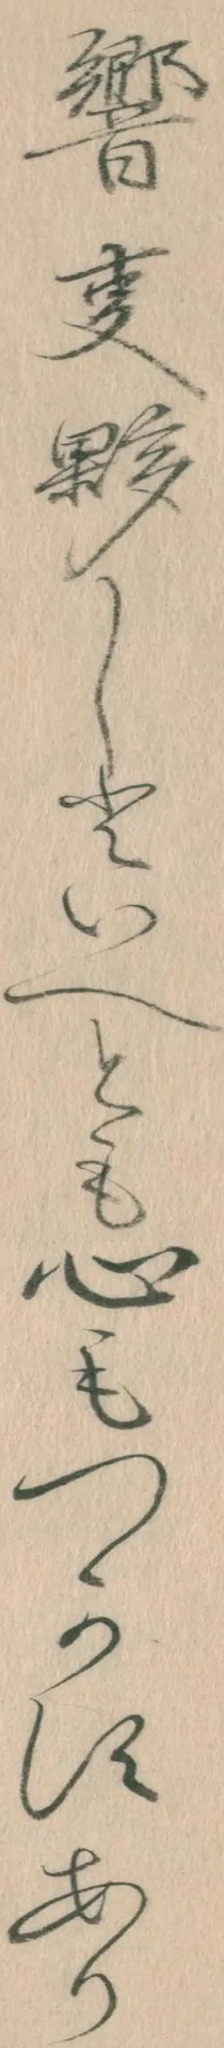響事夥しといへとも心もつかすあり
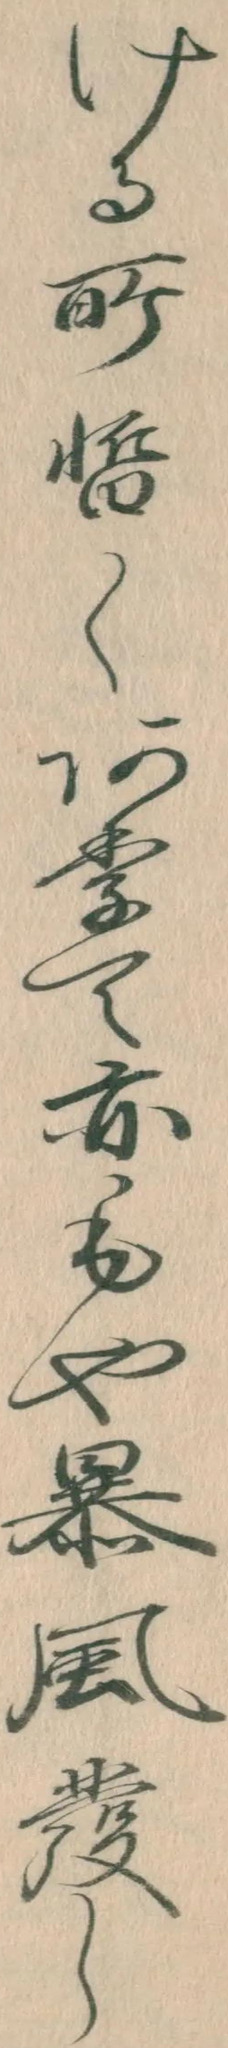ける所暫くありて亦もや暴風発し
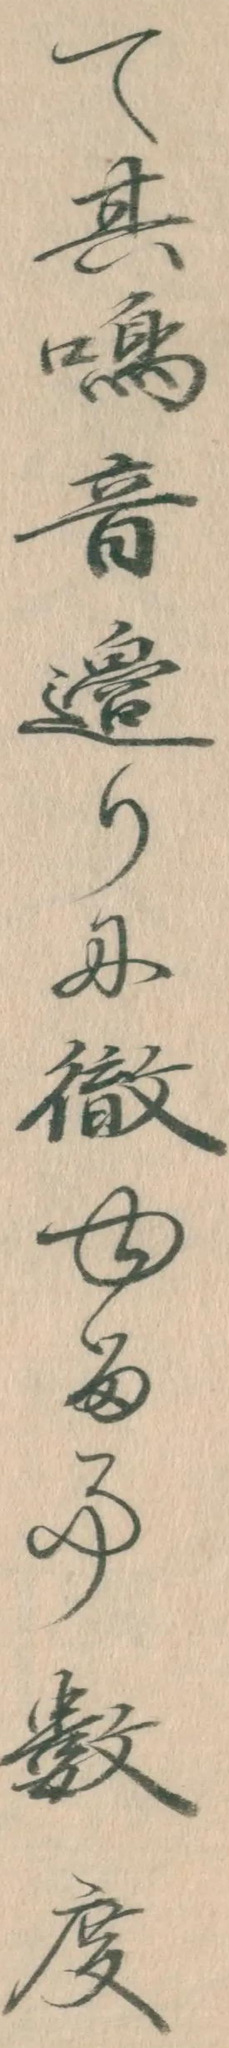て其鳴音辺りに徹ゆる事数度
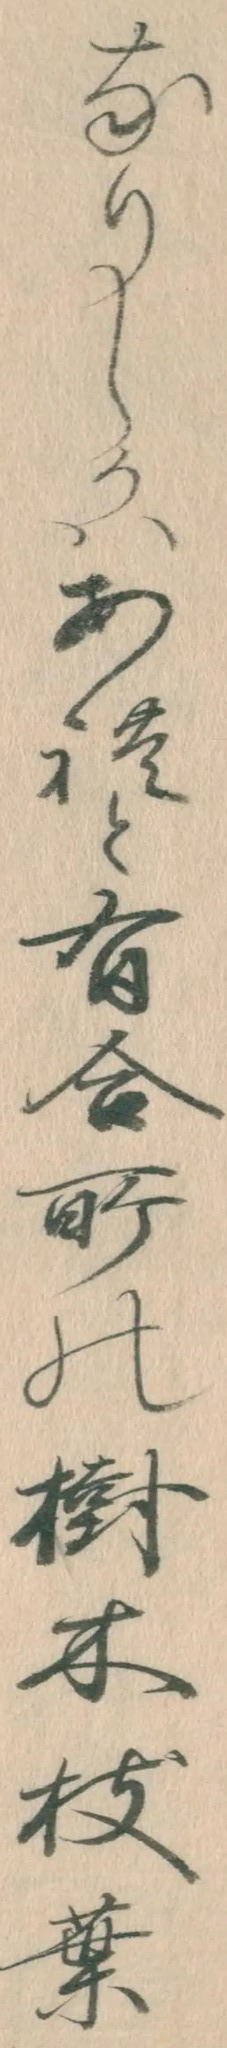なりしかはあれと有合所の樹木枝葉
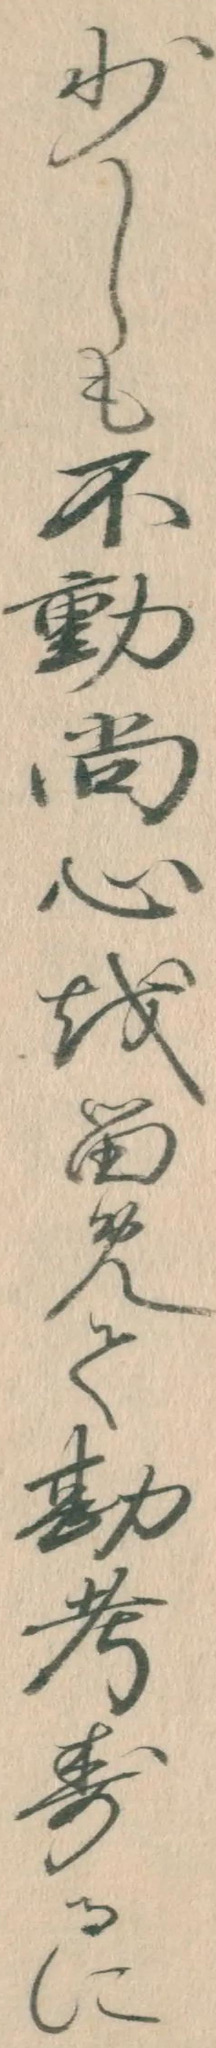少しも不動尚心を留めて勘考するに
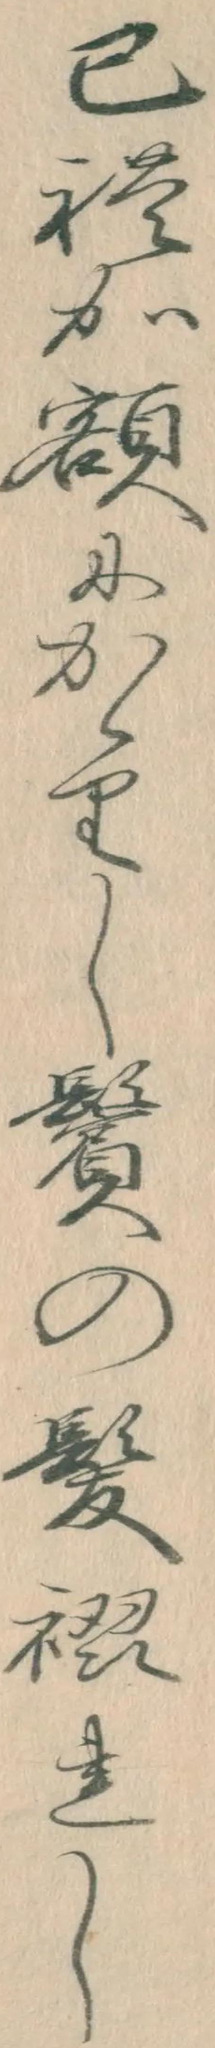己れか額にかゝりし鬢の髪䄌れし

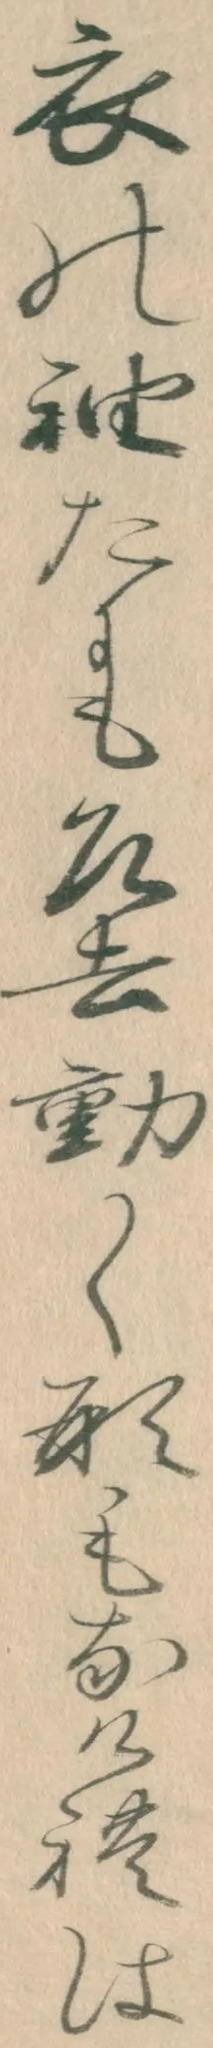衣の袖たにも乍去動く形もなけれは
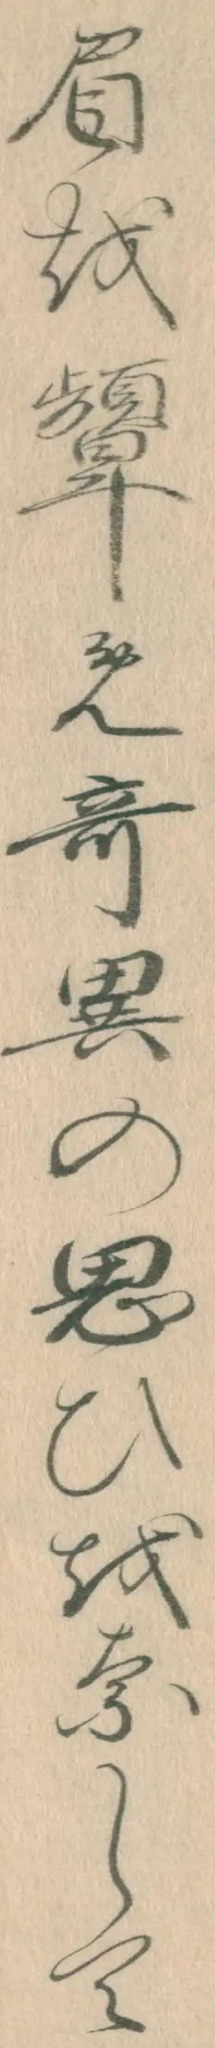眉を顰め奇異の思ひをなして
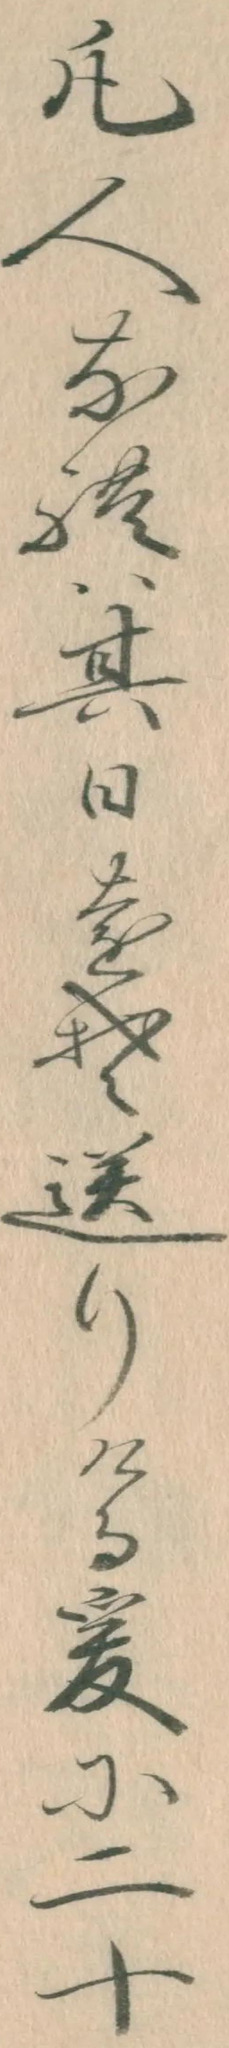凡人なれは其日をそ送りける爰に二十
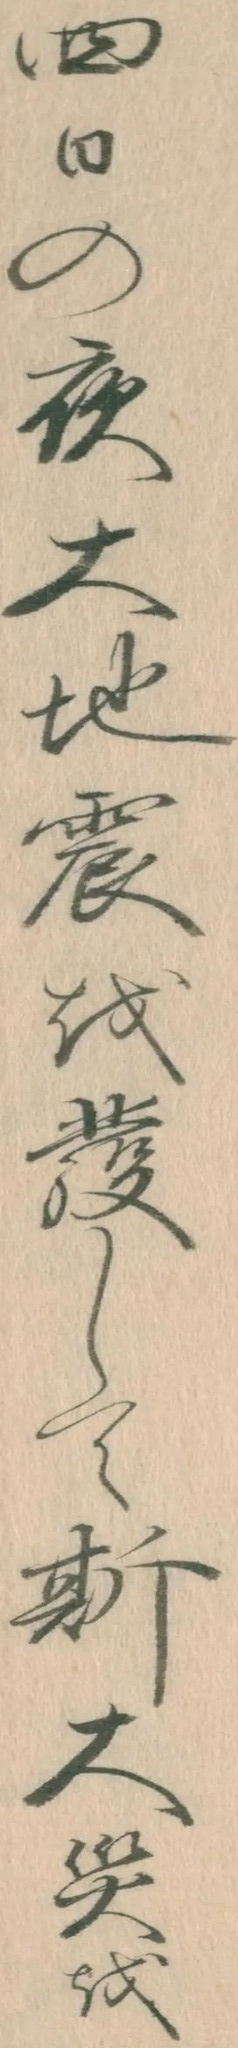四日の夜大地震を発して斯大災を
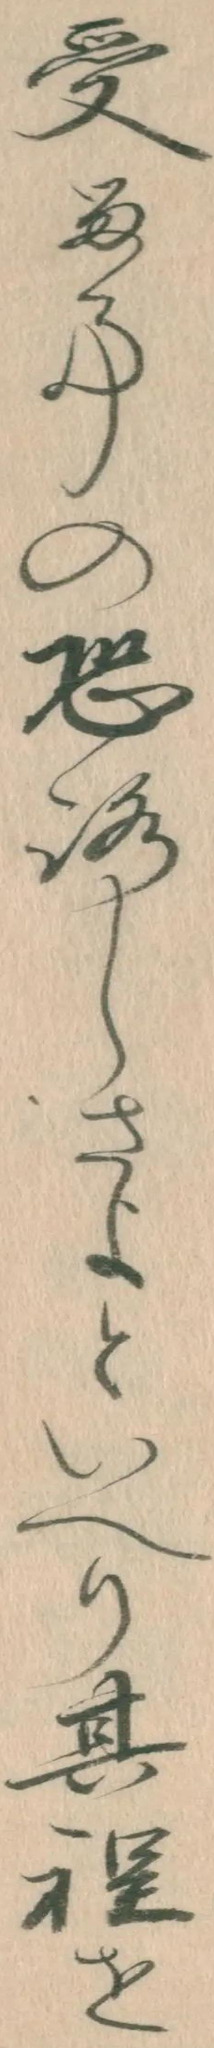受る事の恐ろしさよといへり其程を
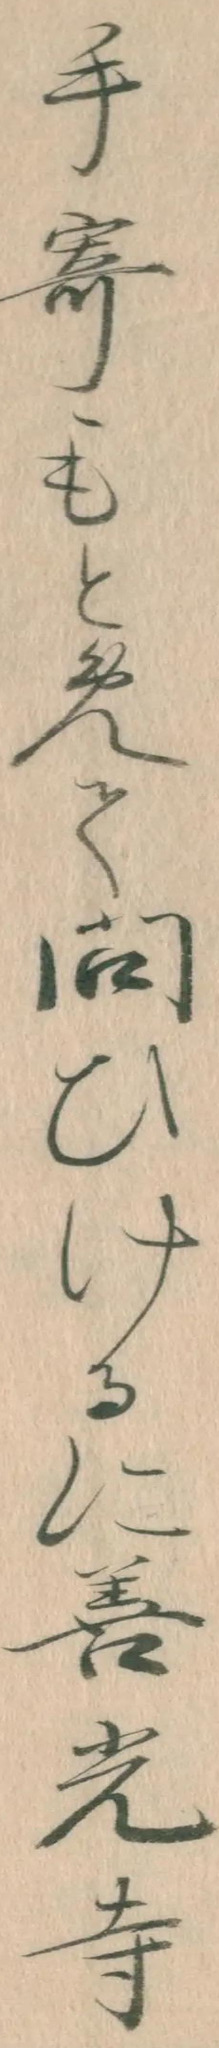手寄もとめて問ひけるに善光寺
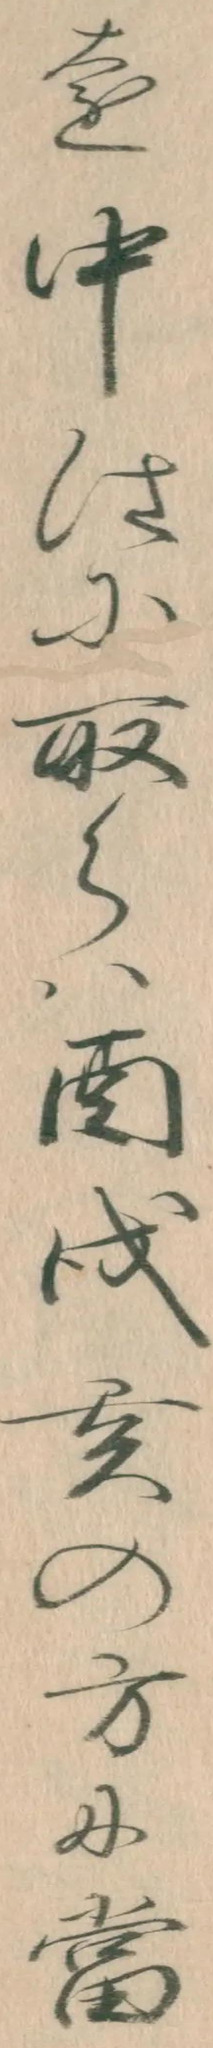を中はに取らは酉戌亥の方に当
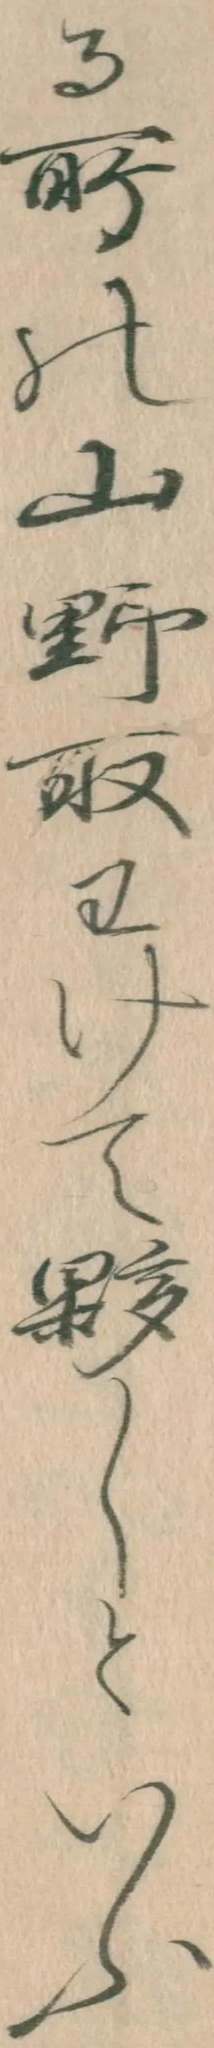る所の山野取わけて夥しといふ
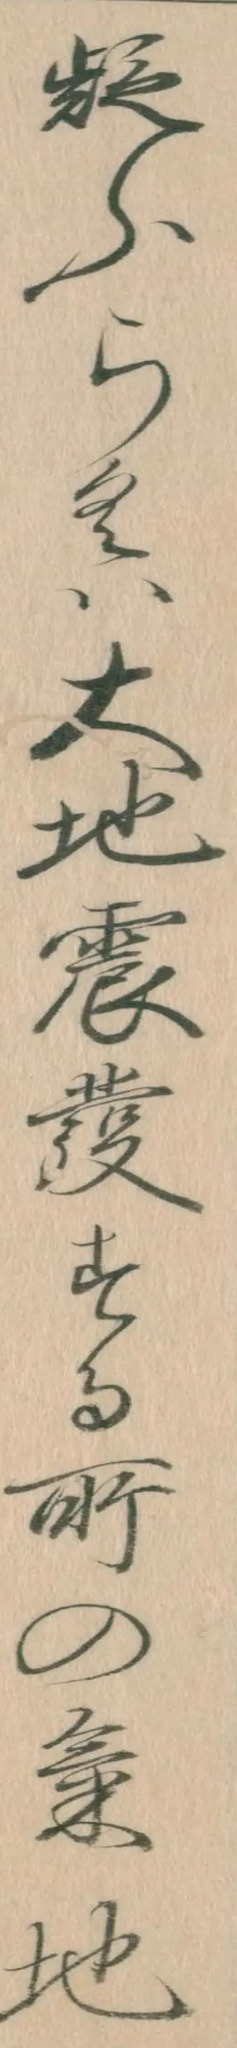疑ふらくは大地震発する所の気地
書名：俗語之種. [6]
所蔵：国立国会図書館 National Diet Library, JAPAN
